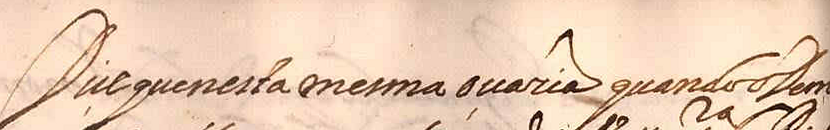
Dice que nesta mesma occaziaõ quando o Dem
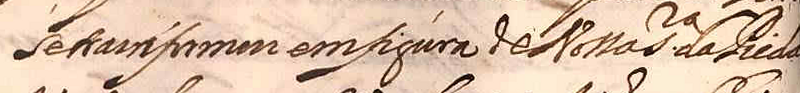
se transformou em figura de Nossa s.ra da Pieda
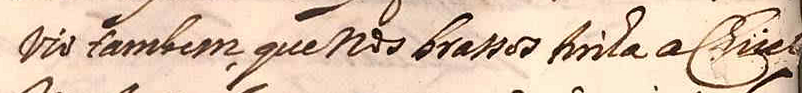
vio tambem, que nos brassos tinha a Christ
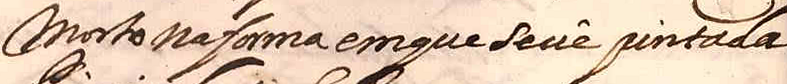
morto na forma em que se uê pintada
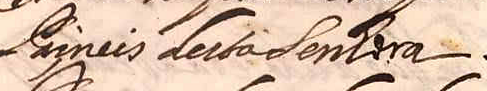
Paineis desta Senhora.
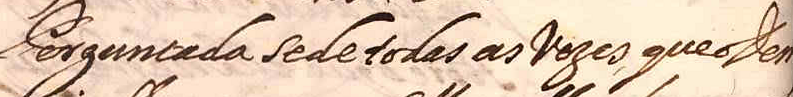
Perguntada se de todas as Vezes, que o Dem
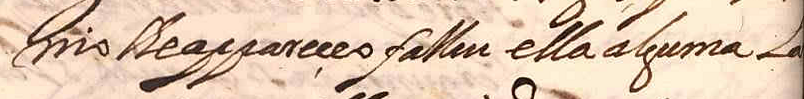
nio lhe appareceo fallou ella alguma La
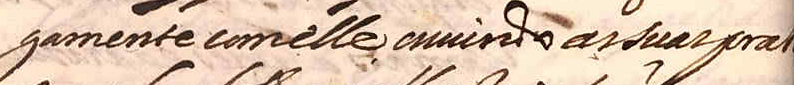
gamente com elle, ouuindo as suas pra
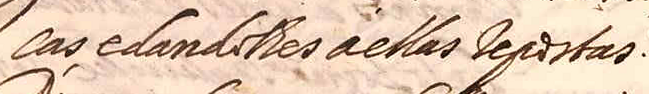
cas, e dandolhes a ellas Repostas?
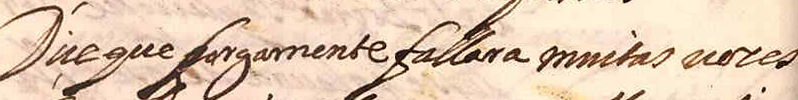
Dice que largamente fallara muitas uezes
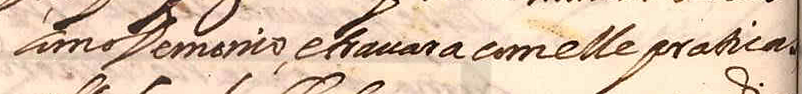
sim o Demonio e trauara com elle praticas
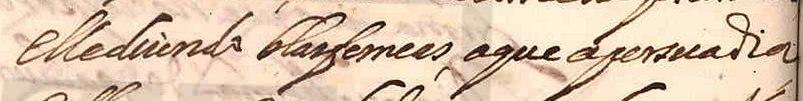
elle dizendo blasfemeas, a que a persuadia
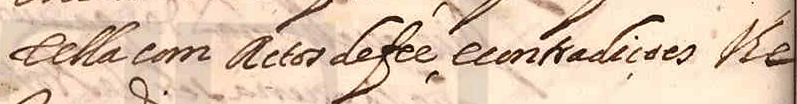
e ella com Actos de fee, e contradiçoẽs lhe
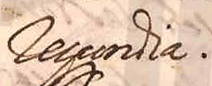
Respondia.
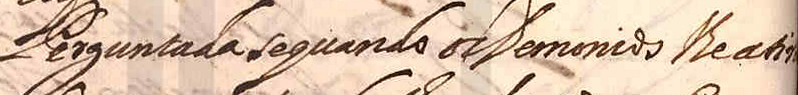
Perguntada se quando os Demonios lhe atir
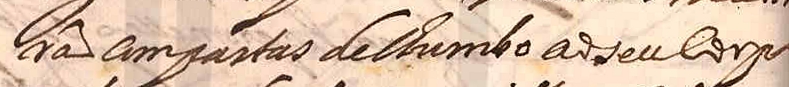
raõ com portas de chumbo ao seu corpo
